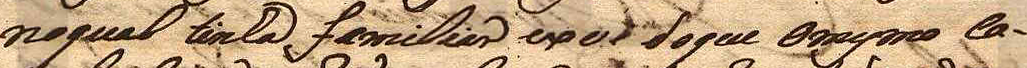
no qual tinha familiar exvi do que o mesmo ca
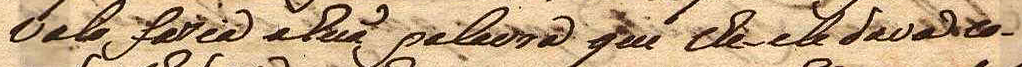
valo fazia a huā palavra que lhe-ele dava co
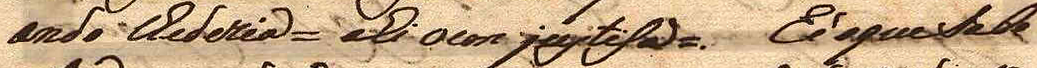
ando lhe dezia= ahi vem justisa=. hé o que Sabe
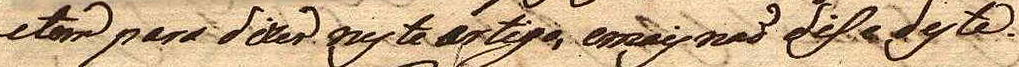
e tem para dizer neste artigo, e mais naõ dise deste.
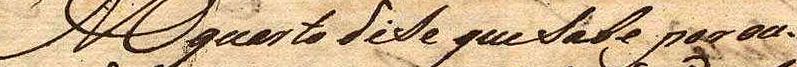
Ao quarto diSe que Sabe por ou
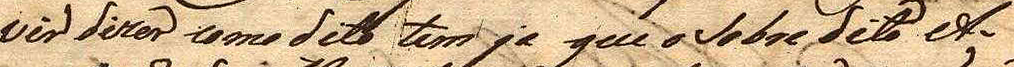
vir dizer como dito tem ja que o sobre dito A
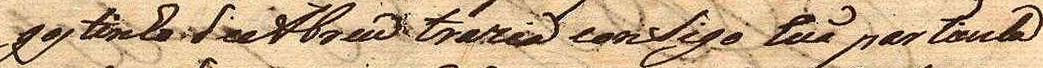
gostinho de Abreu trazia conSigo huā particula
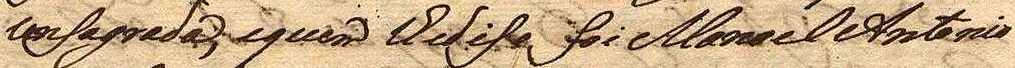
consagrada, e quem lhe dise foi Manoel Antonio
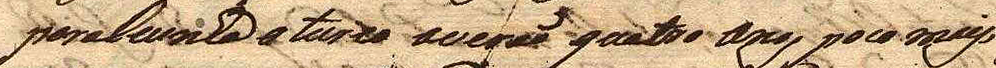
por alcunha o turco averaõ quatro anos poco mais,
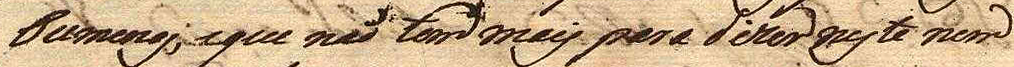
ou menos, e que naõ tem mais para dizer neste nem
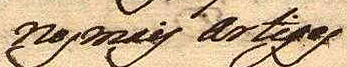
nos mais artigos
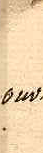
ouv
